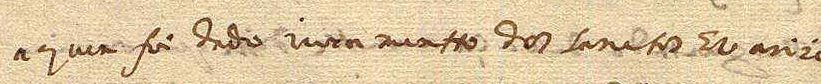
a quem foi dado iuramentto dos sanctos Evanie
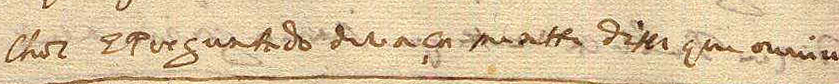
lhos E Perguntado devaçamentte disse que ouuiu
